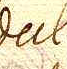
decl.
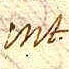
int.
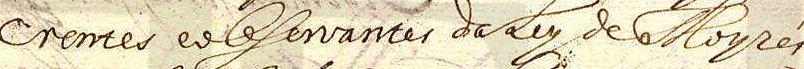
crentes e observantes da Ley de Moyzés
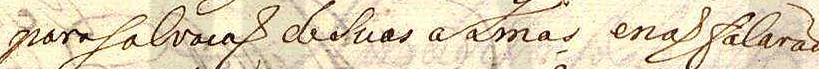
para salvaçaõ de suas almas, e naõ falaraõ
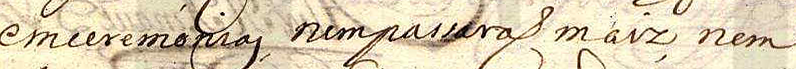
em ceremonias, nem passaraõ maiz, nem
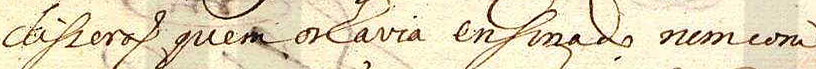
disseraõ quem os havia ensinado, nem com
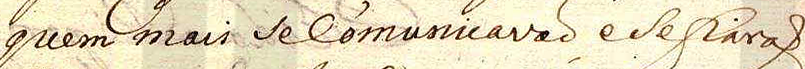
quem mais se cōmunicavaõ, e se fiaraõ
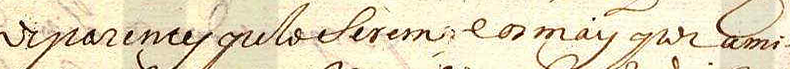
os parentes pelo serem e os mais por ami
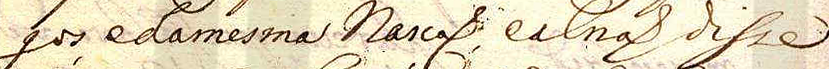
gos, e da mesma Nasçaõ, e al naõ disse
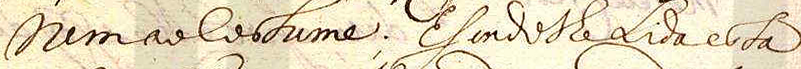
Nem ao Costume; E sendolhe Lida esta
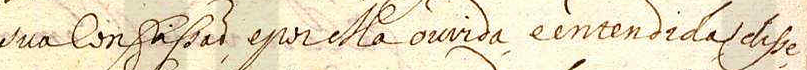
sua Confissaõ, e por ella ouvida, e entendida, disse,
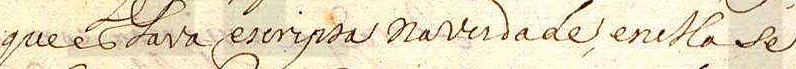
que estava escripta na verdade, e nella se
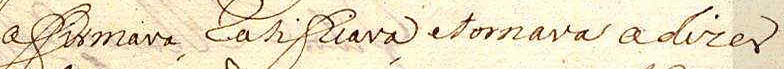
affirmava, Ratificava, e tornava a dizer
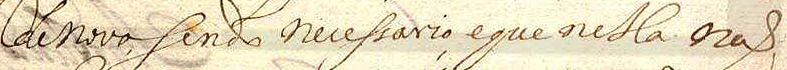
de novo, sendo necessario, e que nella naõ
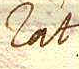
Rat.
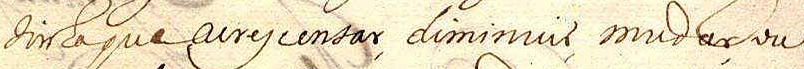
tinha que acrescentar, diminuir, mudar, ou
